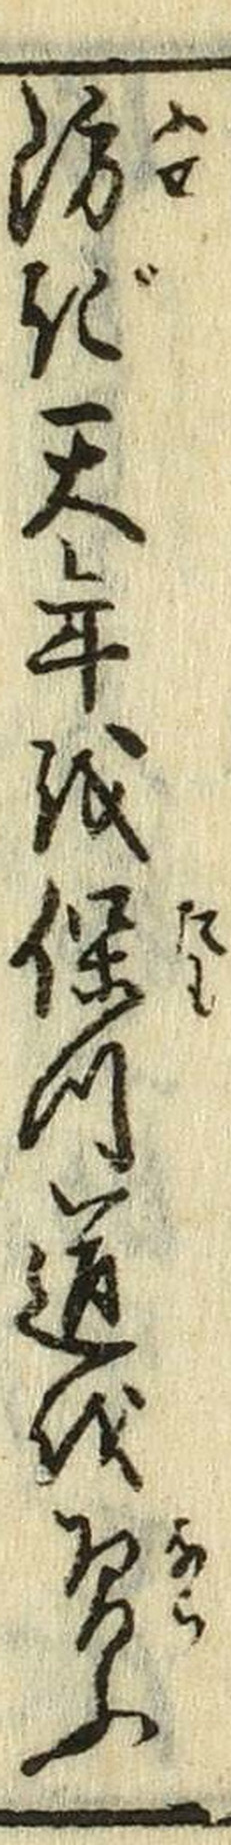防ぎ天年を保つ道を習ふ
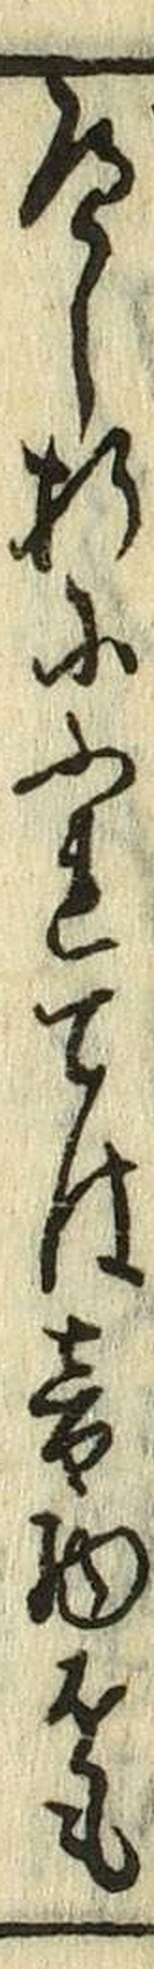べし折にふれては音物をも
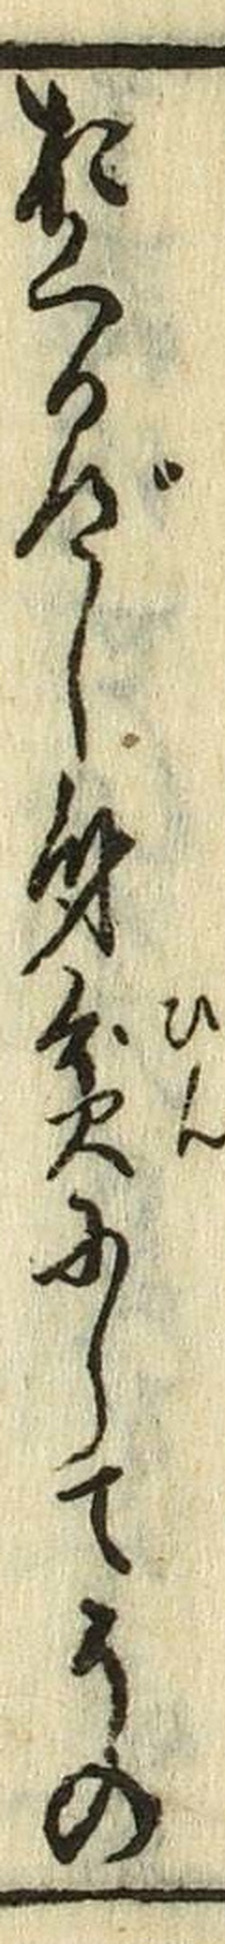おくるべし身貧にしてその
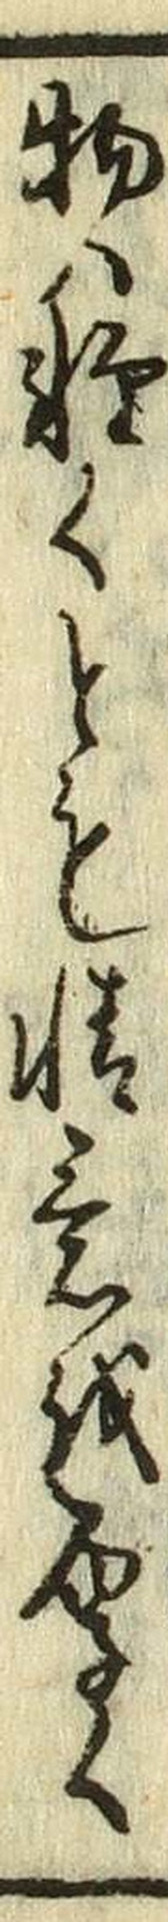物は軽くとも情意を厚く
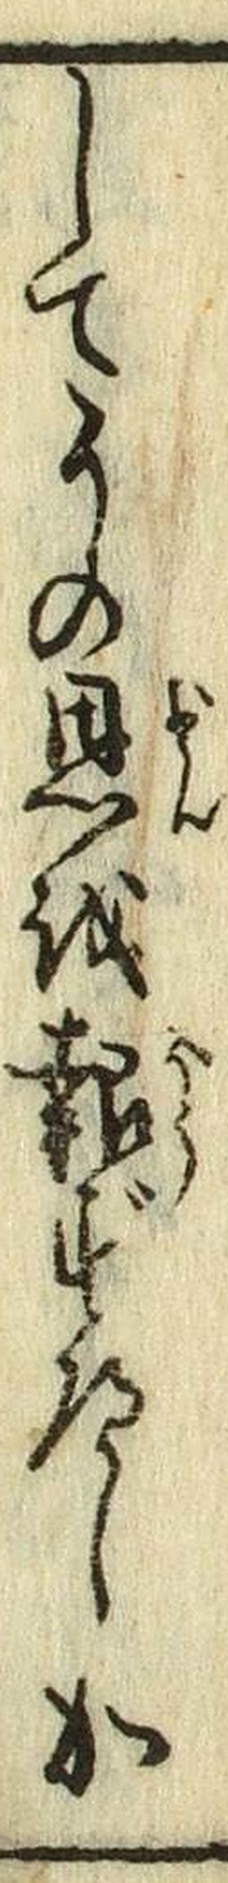してその恩を報ずへしか
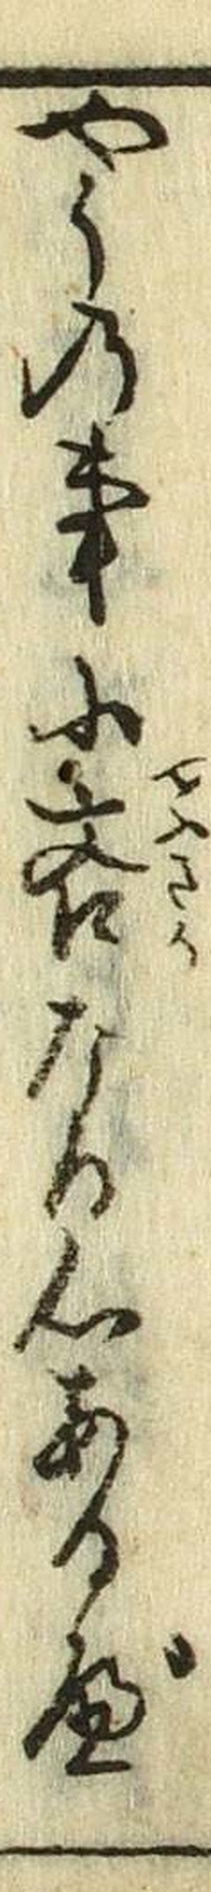やうの事に吝なる心あるべ
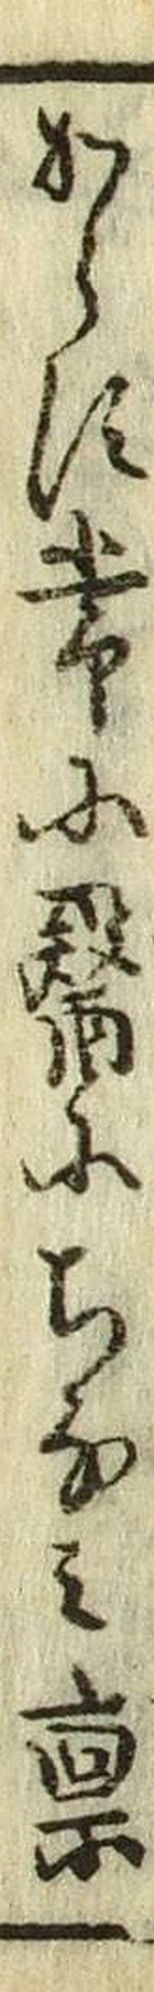からず常に医にちなみ稟
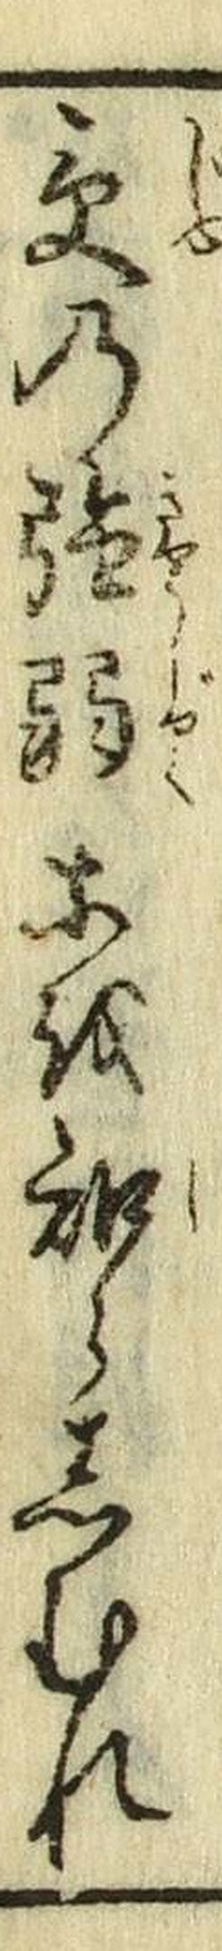受の強弱等を知らしむれ

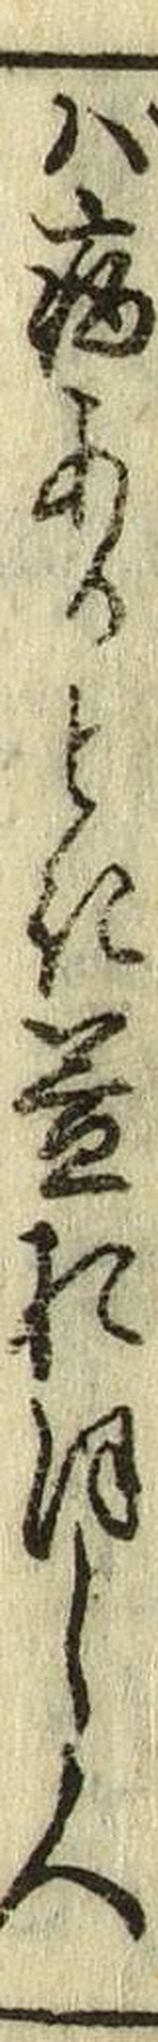ば病あるとき益おほし人
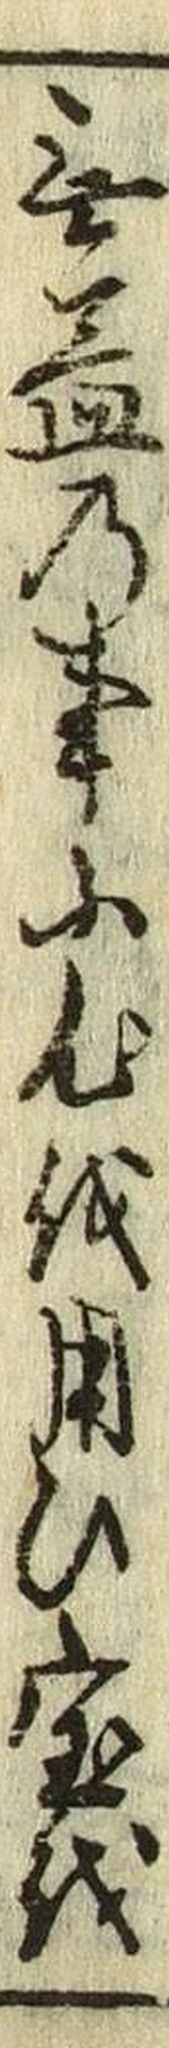無益の事に心を用ひ宝を
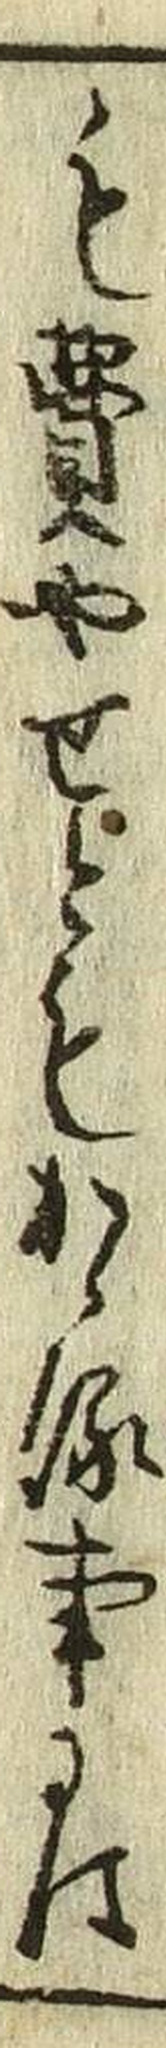も費やせどもかゝる事には
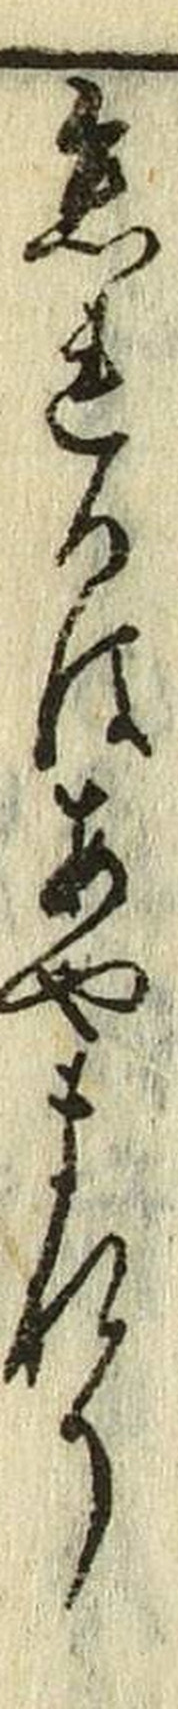怠れるはあやまれり
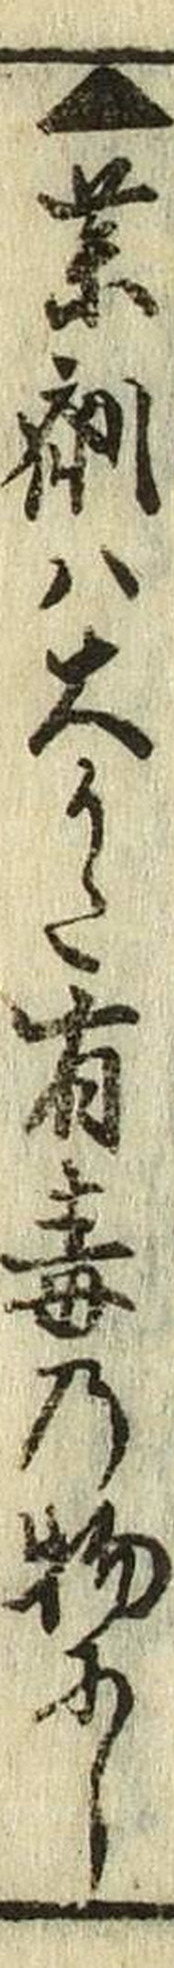▲薬剤は大かた有毒の物にし
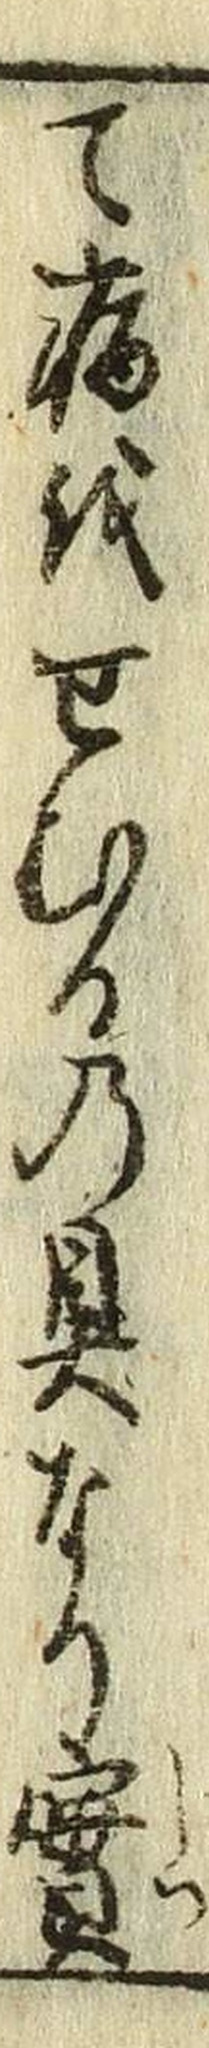て病をせむるの具なり実
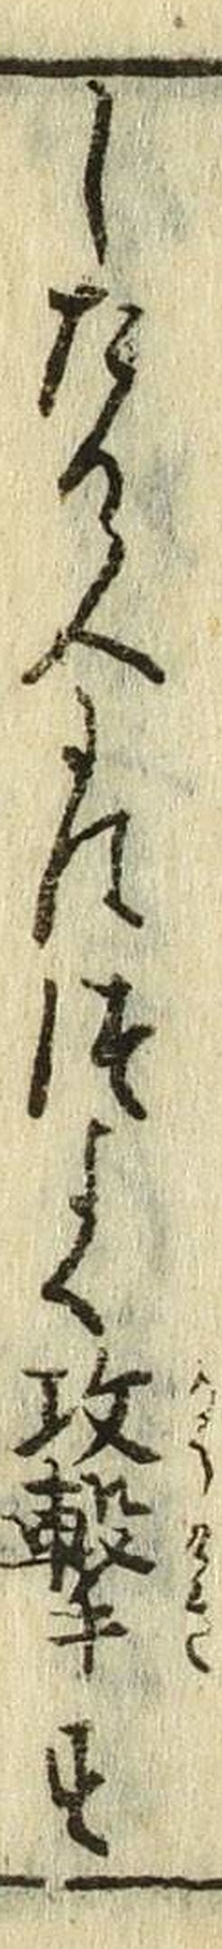したる人にはつよく攻撃す
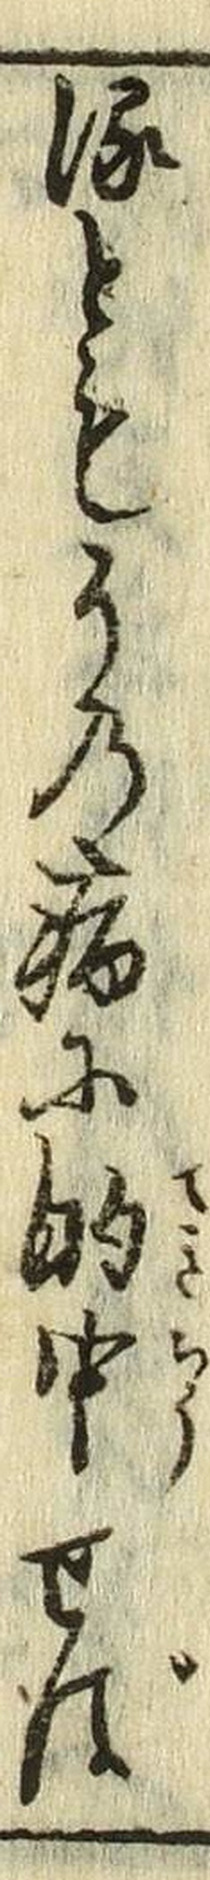るともその病に的中せば
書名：居家養生記
